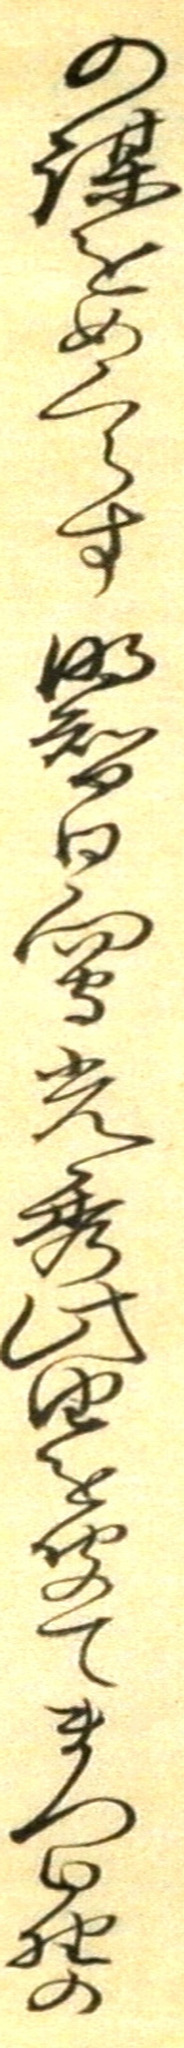の謀をめくらす明智日向守光秀此由を決てまつ日野の
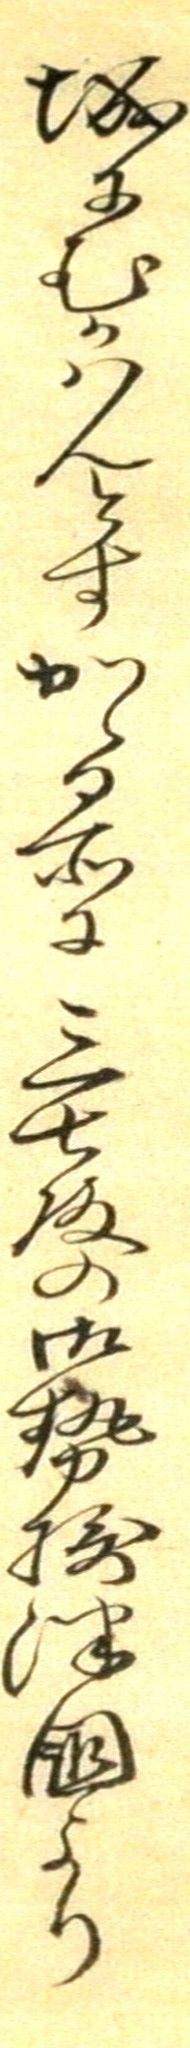城にむかはんとすかゝる所に三七殿の御勢摂津国より
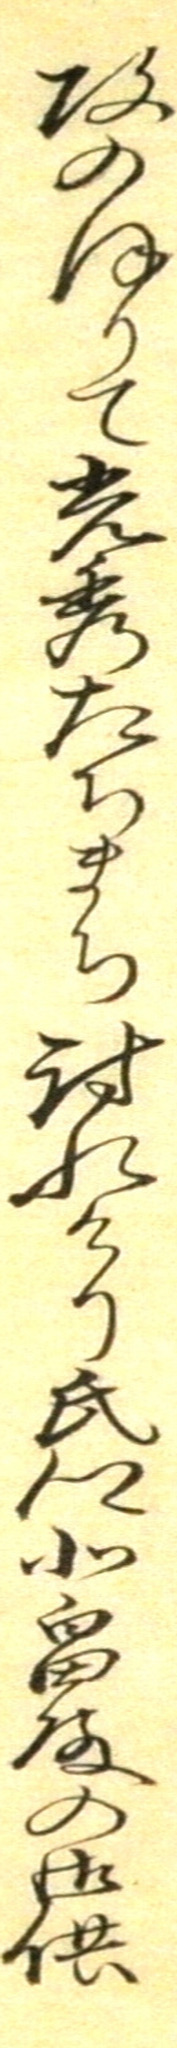坂のほりて光秀たちまち討れけり氏郷北畠殿の御供
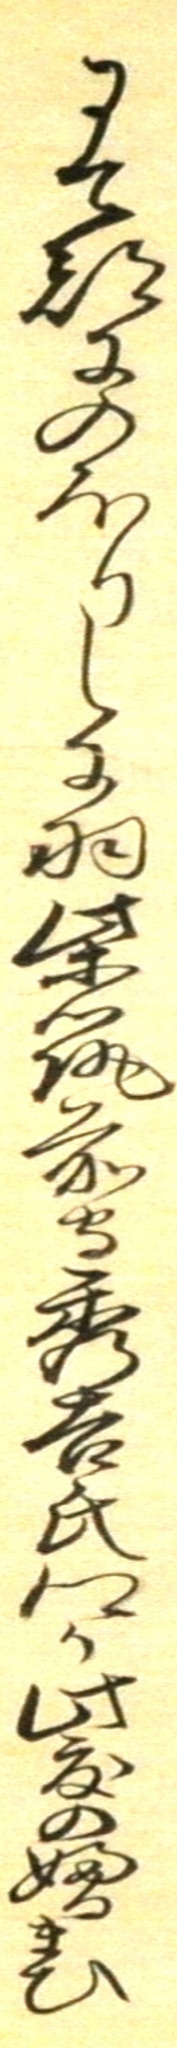にて都にのほりしに羽柴筑前守秀吉氏郷か此度のふるまひ
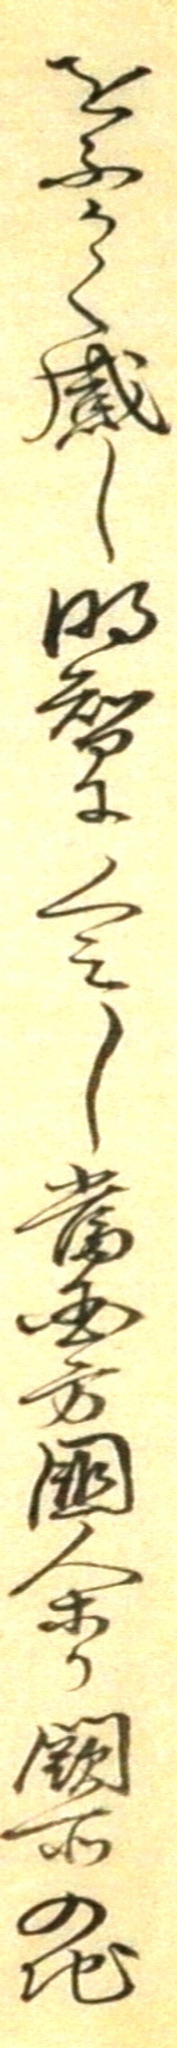をふかく感し明智にくみし当国方国人こり欠所の地
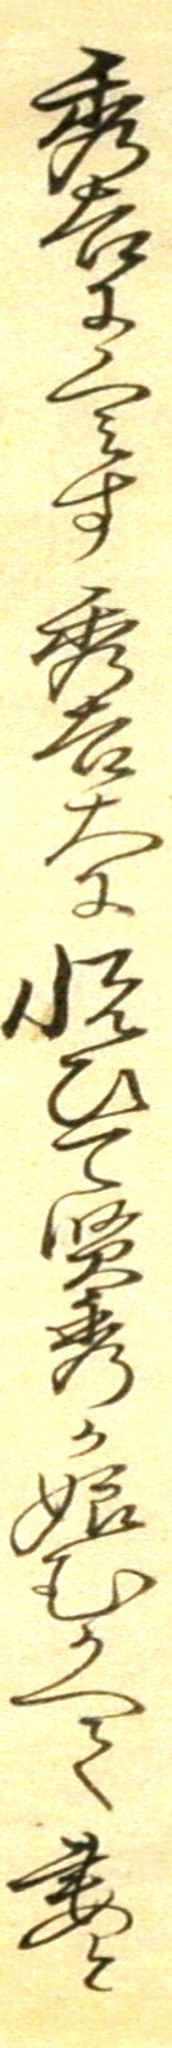秀吉にくみす秀吉大に悦ひて賢秀か娘むかへて妻と
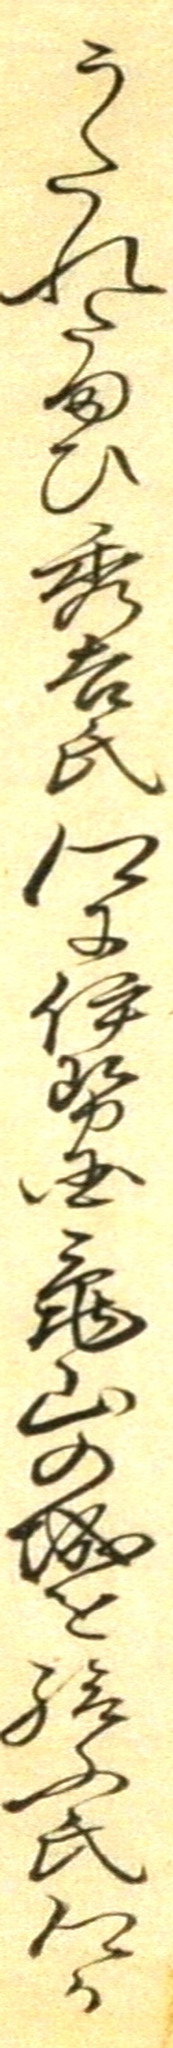うたれたまひ秀吉氏郷に伊勢国亀山の城を給ふ氏郷か
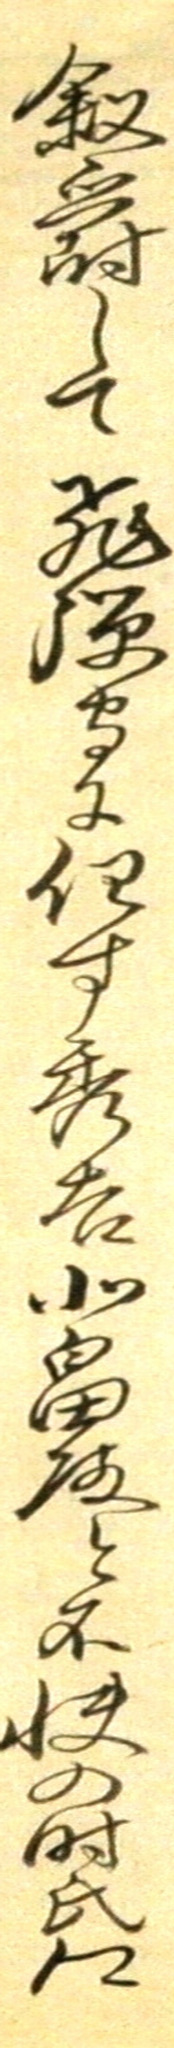叙爵して飛騨守に任す秀吉北畠殿と不快の時氏郷
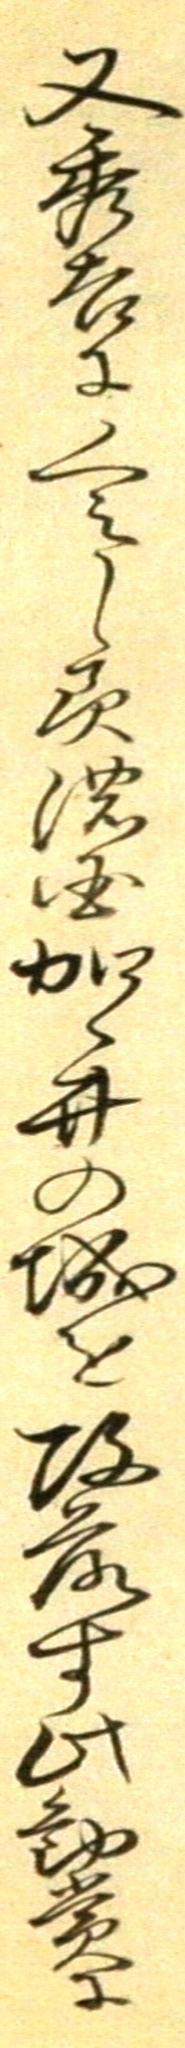又秀吉にくみし美濃国かゝ井の城を攻落す此勘賞に

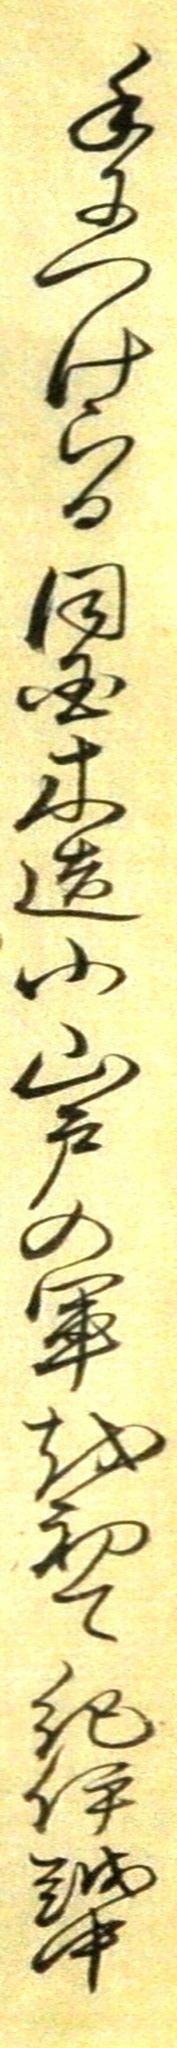手につけらる同国木造内山戸の軍を初て紀伊越中
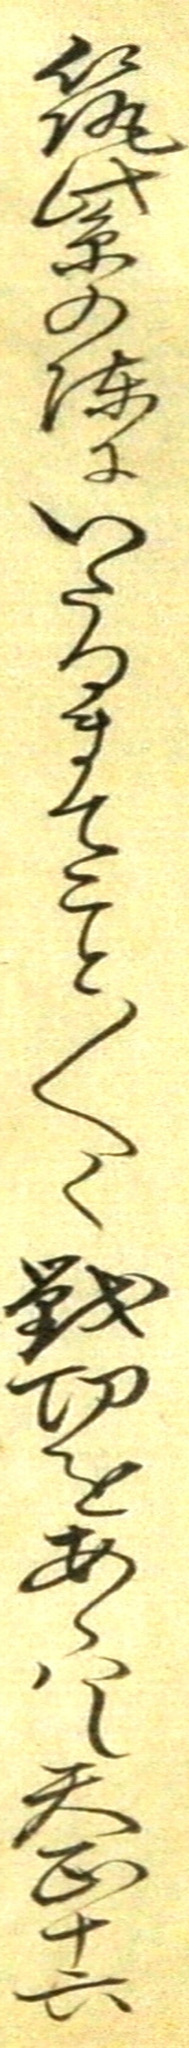築紫の陣にいたるまてこと〳〵く戦功をあらハし天正十六
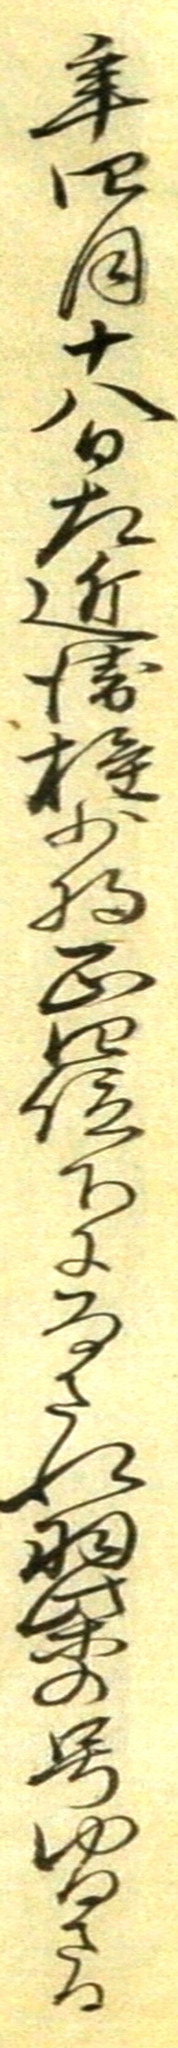年四月十八日左近衛権少将正四位下になされ羽柴の号ゆるさる
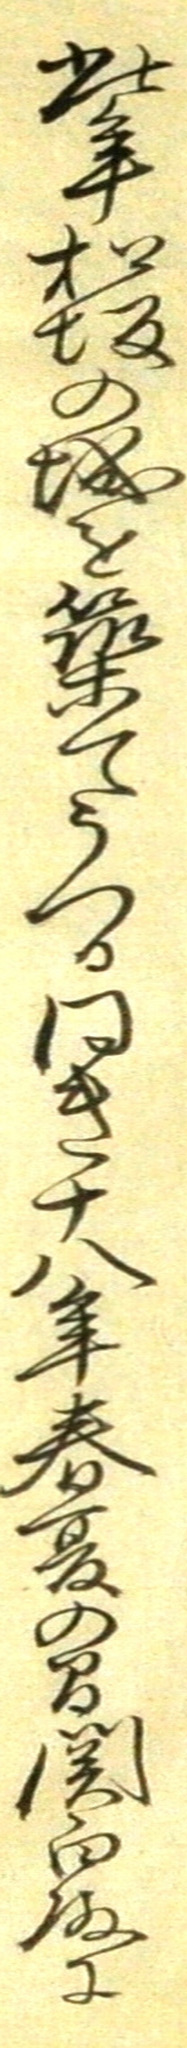此年松坂の城を築てうつる同き十八年春夏の間関白殿に
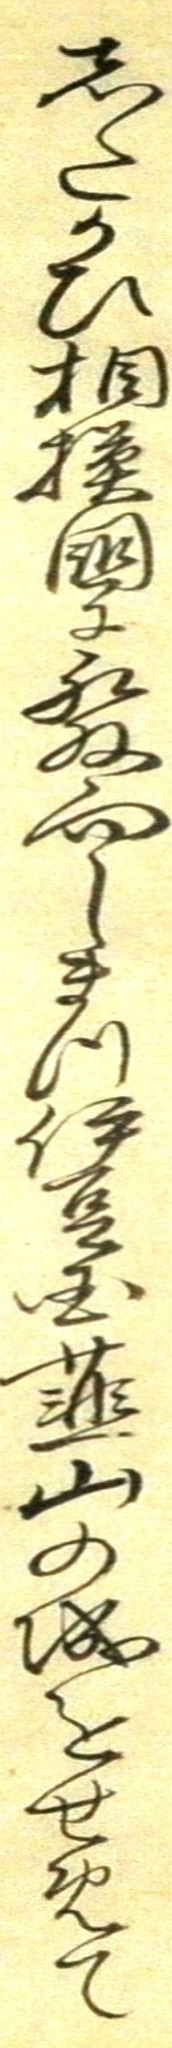したかひ相模国に発向しまつ伊豆国韮山の城をせめて
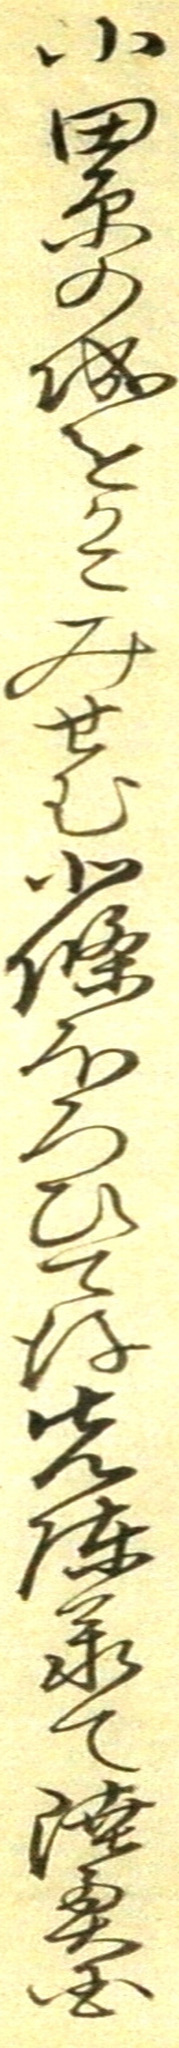小田原の城をとりこみせむ北條ほろひて後先陣承て陸奥国
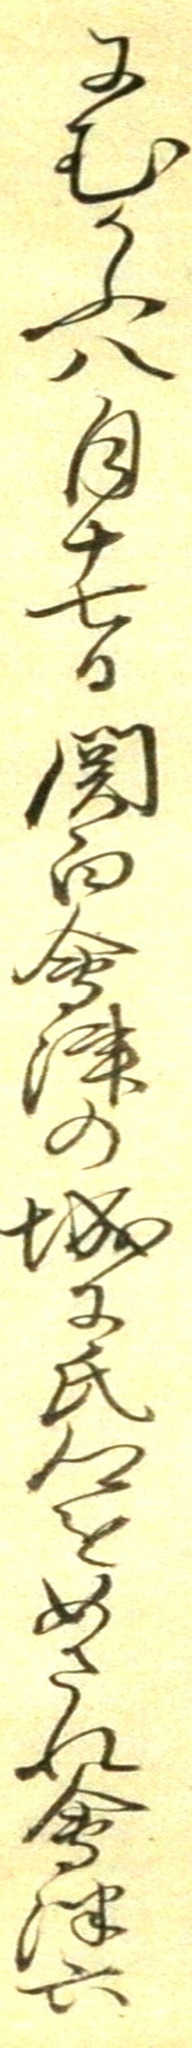にむかふ八月十七日関白会津の城に氏郷をめされ会津六
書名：藩翰譜（十二・上）
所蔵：伊那市立高遠町図書館・合同会社AMANE
